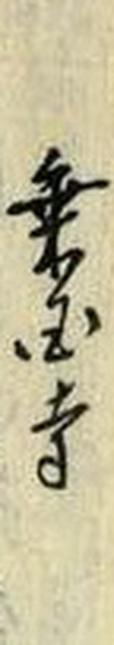乗国寺
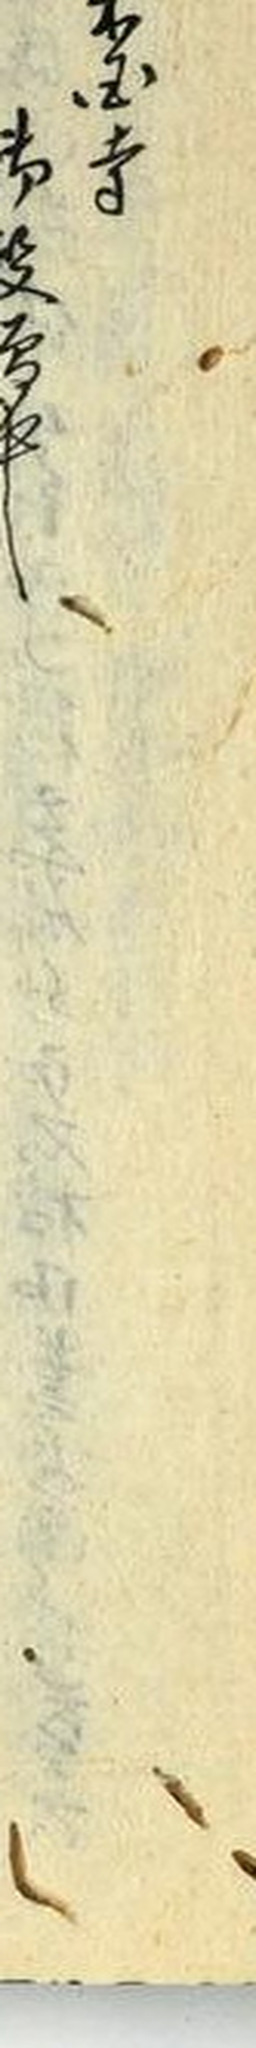御役僧仲
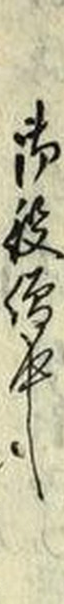御役僧仲
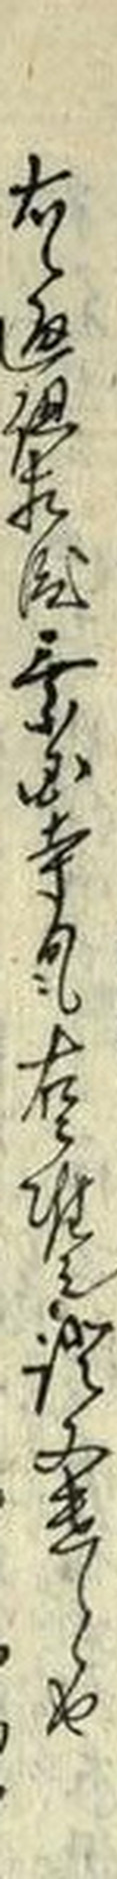右之通認相渡乗国寺ゟも右ニ准シ証文遣之候由
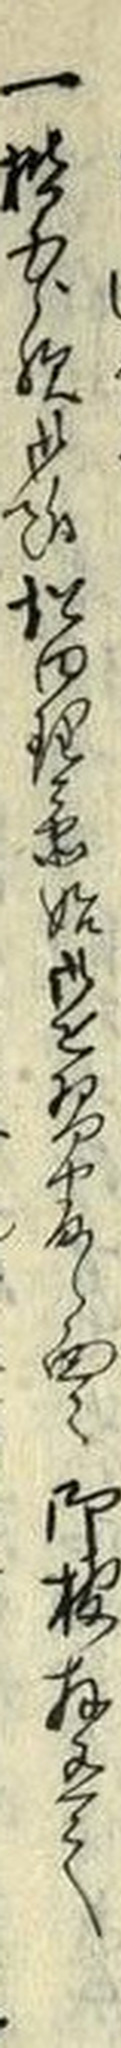一楷五郎様御附松田理兵衛始御近習番之面々御棺拝有之
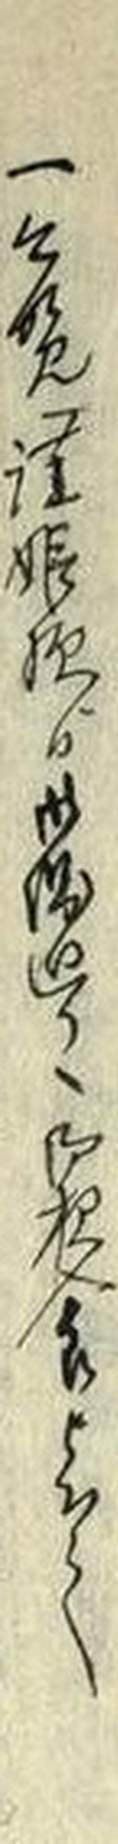一今晩謹姫様ゟ御側廻りへ御夜食被下之
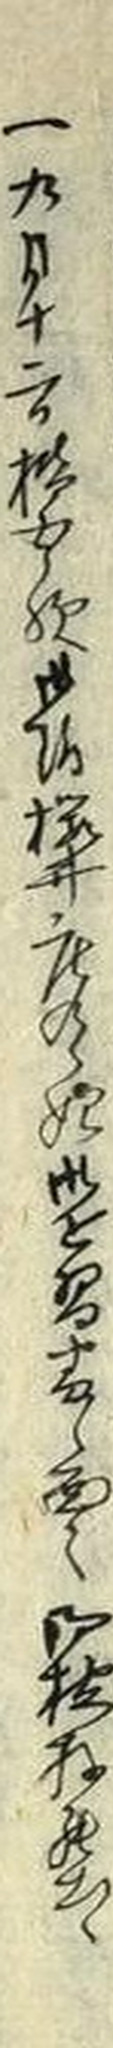一九月十二日楷五郎様御附桜井庄九郎始御近習番之面々御棺拝罷出候
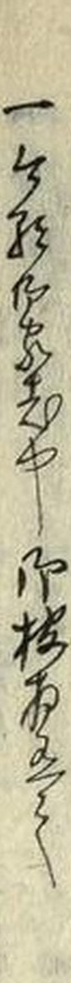一今朝御家老中御棺拝有之
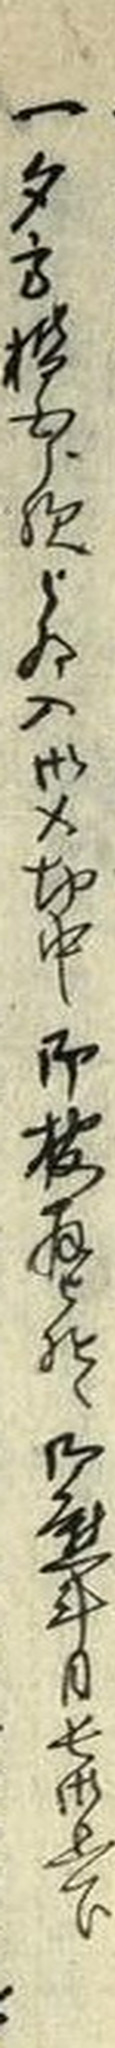一夕方楷五郎様被為入御〆切中御棺拝被遊候御熨斗目長御上下
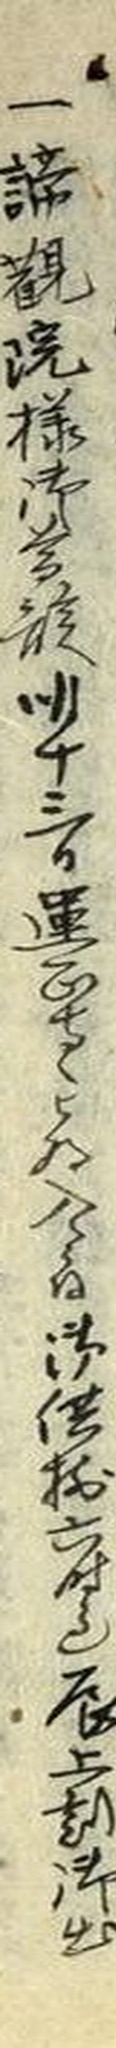一諦觀院様御尊骸明十三日運正寺へ被為入候ニ付御供揃六時過辰上刻御出
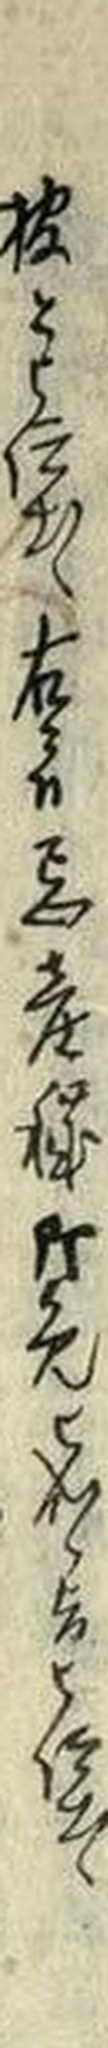棺と被仰出候右ニ付忌産穢御免被成候旨被仰出候
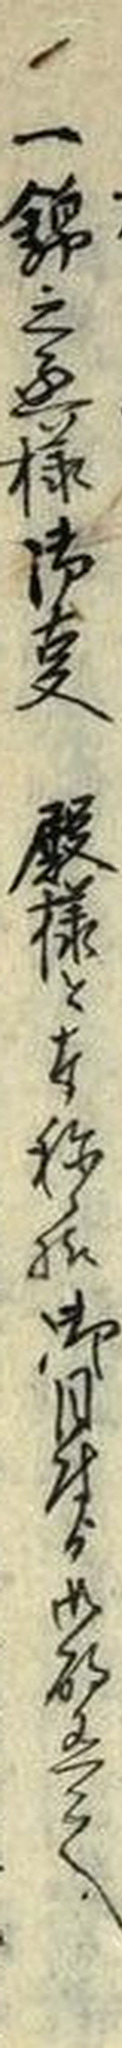一錦之丞様御事殿様と奉称候様御目付ゟ御触有之
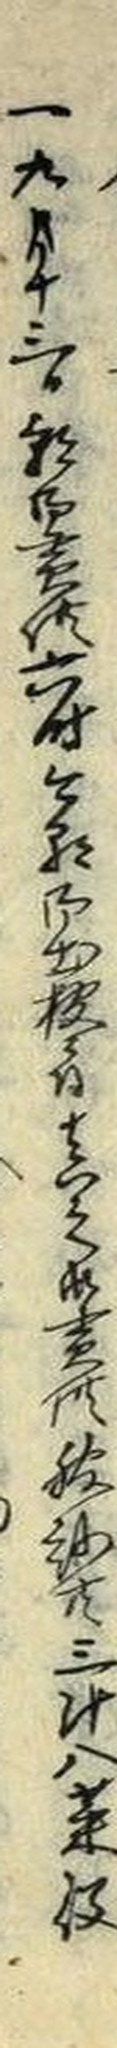一九月十三日朝御霊供六時今朝御出棺ニ付真之御霊供服紗共三汁八菜役
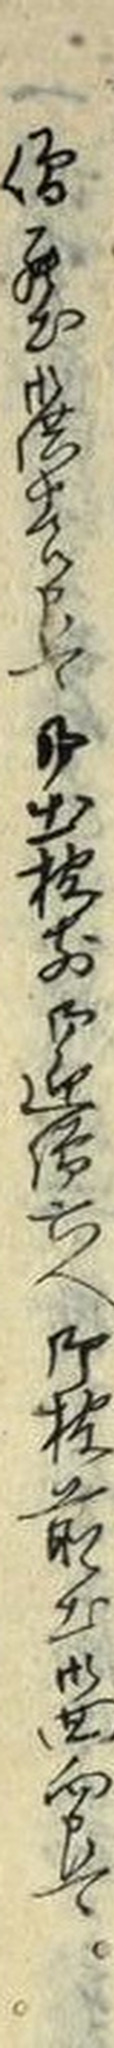僧罷出御供養申上候御出棺前御迎僧六人御棺前へ出御回向申上候

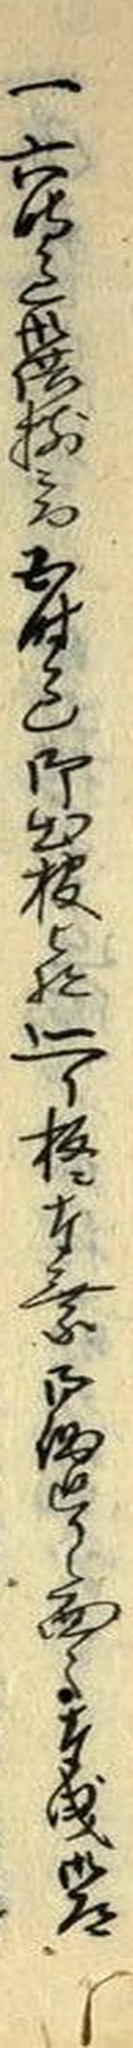一六時過御供揃ニ而五時過御出棺被遊上り板ニ奉乗御側廻り面々奉曳御道
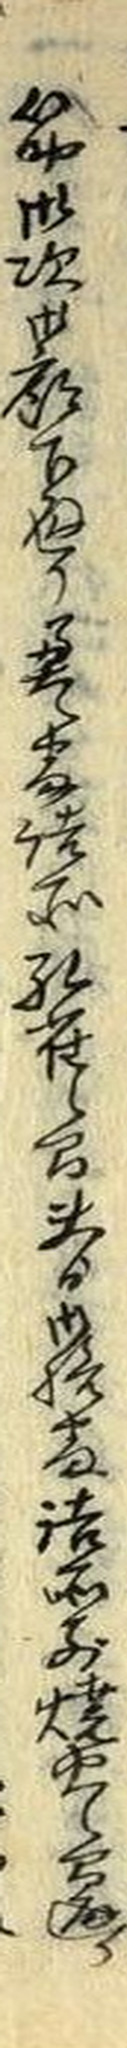筋御次御廊下通り奥之番詰所孔雀之間夫ゟ御膳番詰所前焼火間通り
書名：少傅日録抄（斉善付側向頭取日記、江戸并道中、初入在国、逝去後…
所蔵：福井県文書館 Fukui Prefectural Archives
